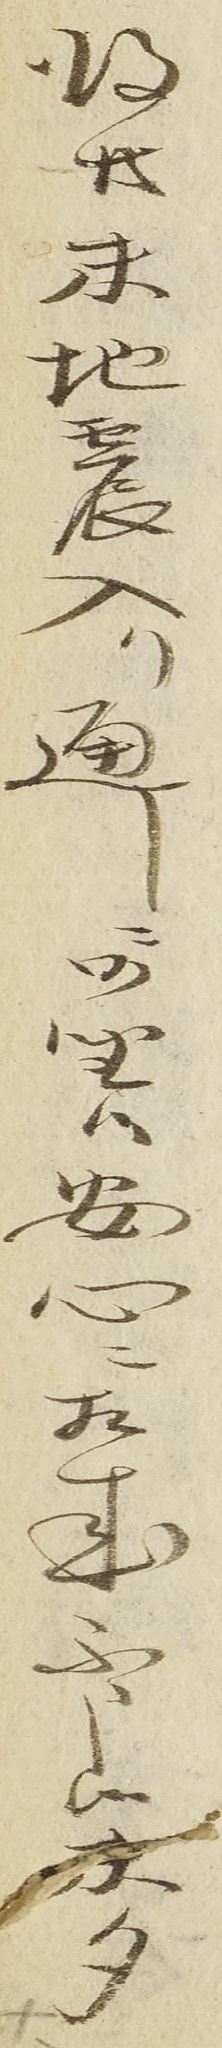得共未地震入り通し二御坐候安心二相成不申候未タ

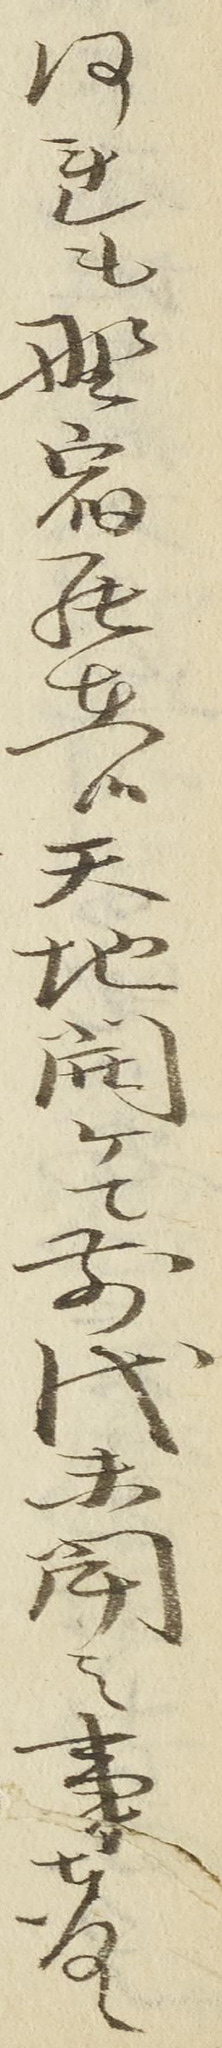何れも野宿罷在候天地開ヶて前代未聞之事二御座候
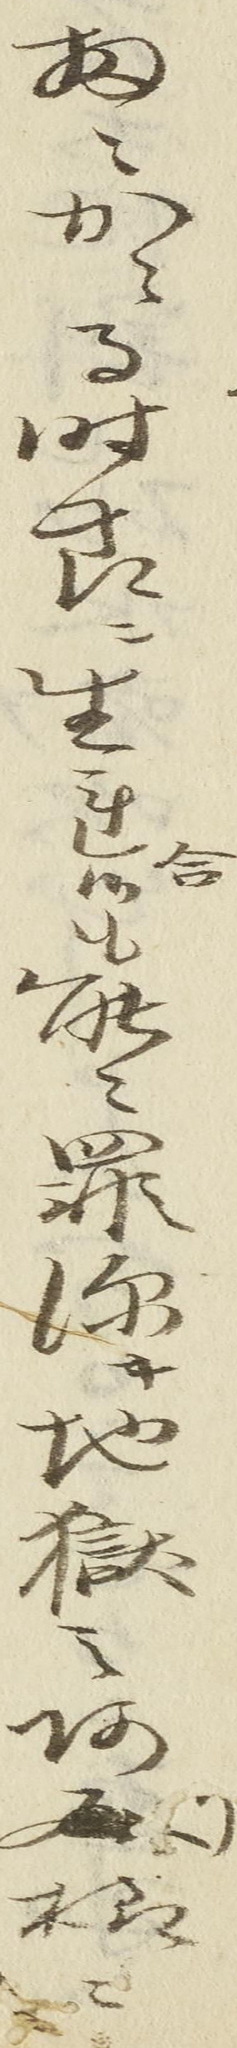扨々かゝる時節に生れ合候も能々罪深キ地獄之あり様二
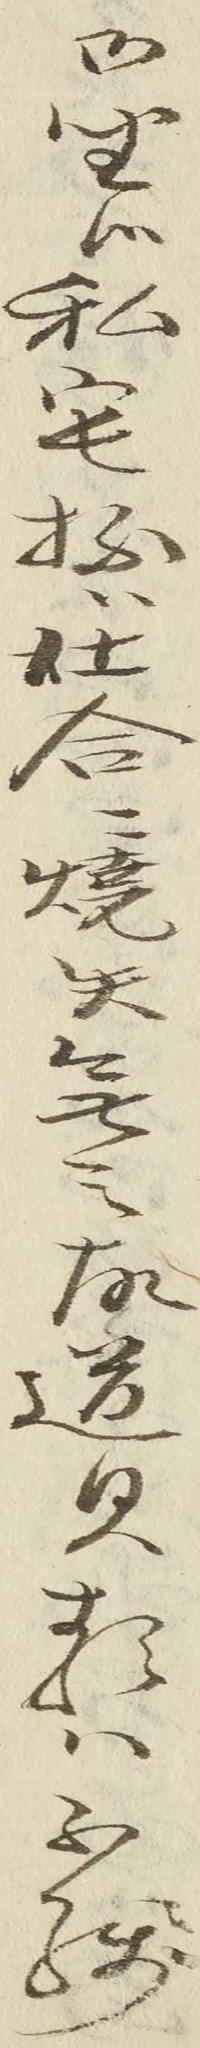御坐候私宅抔ハ仕合二焼失無之故道具類ハ不残
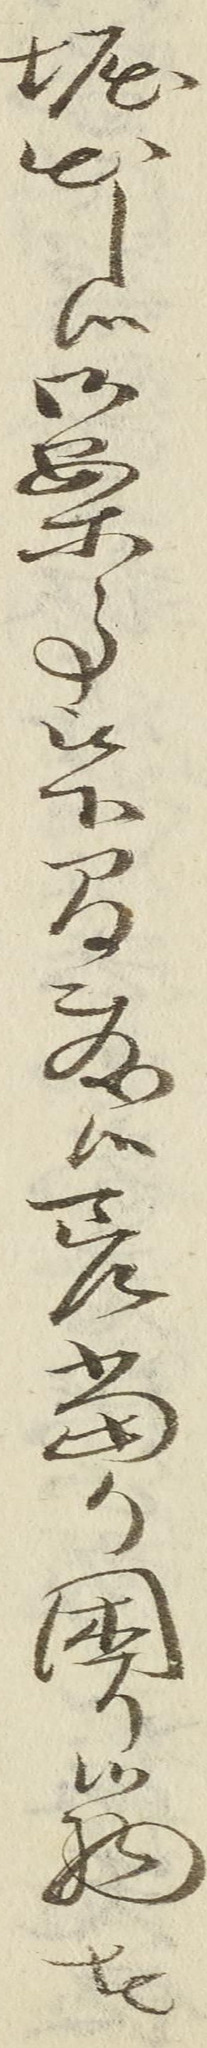堀出ㇱ候御案事被下間敷候差当り困り候物は
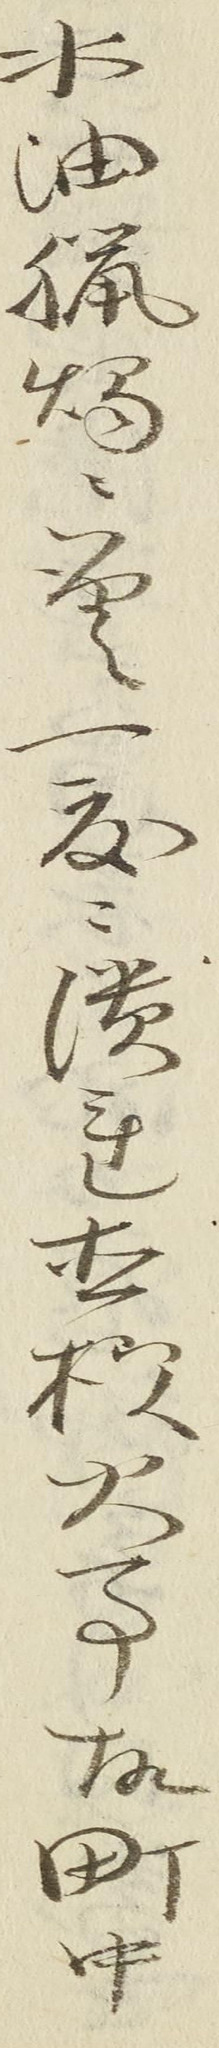水油蝋燭二御坐候一度二潰れ直様火事故町中
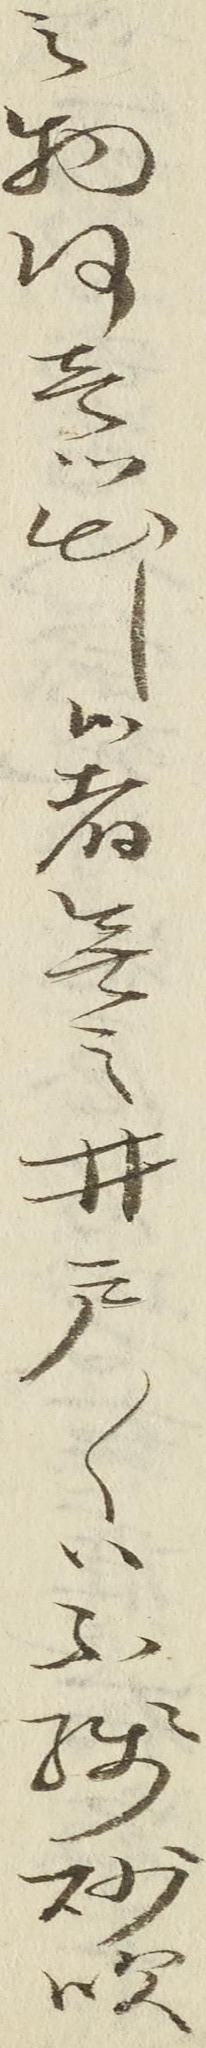之物何壱出し候は無之井戸〳〵も不残砂吹
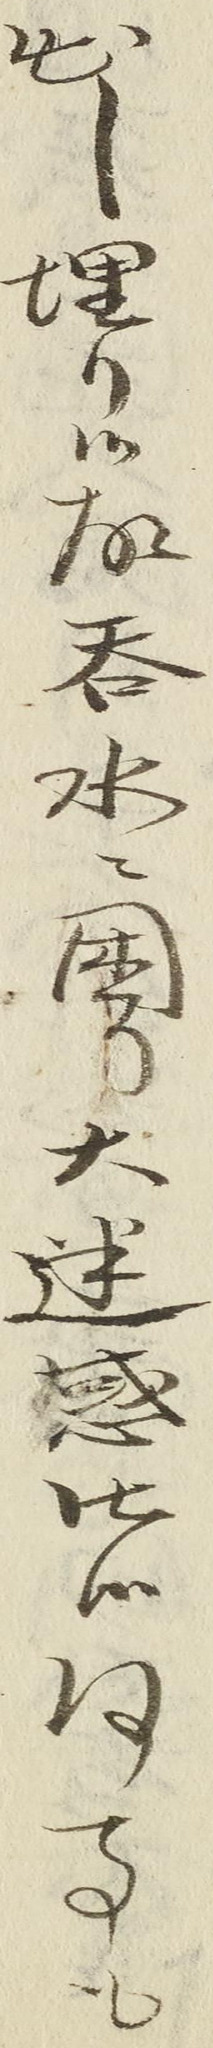出し埋り候故吞水二困り大迷惑仕候何事も
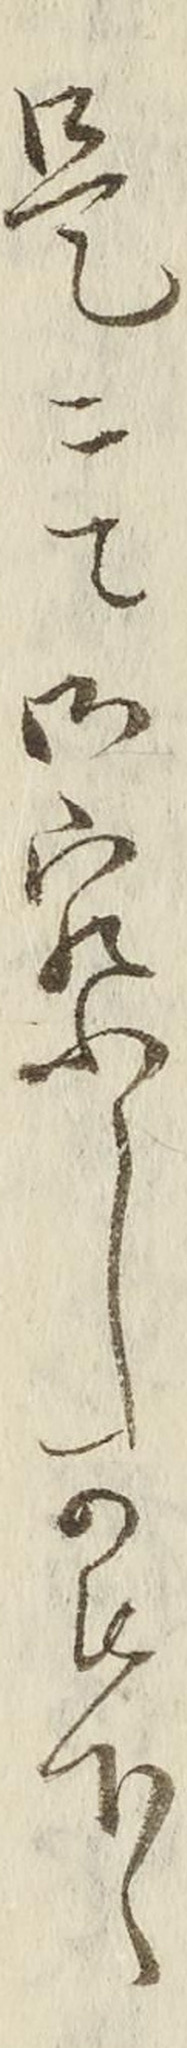是二而御察可被下候
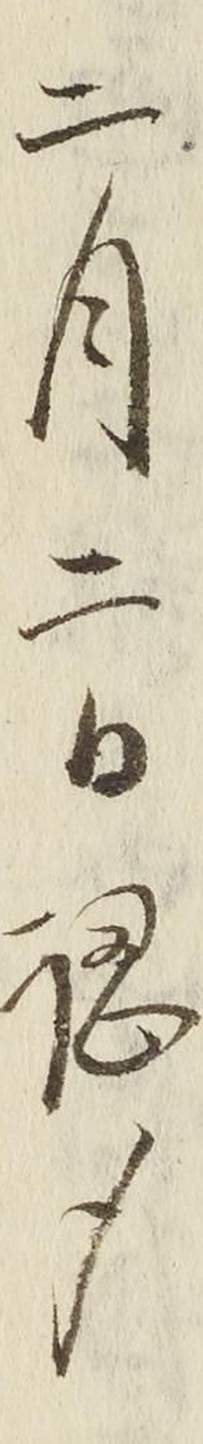四月二日認メ
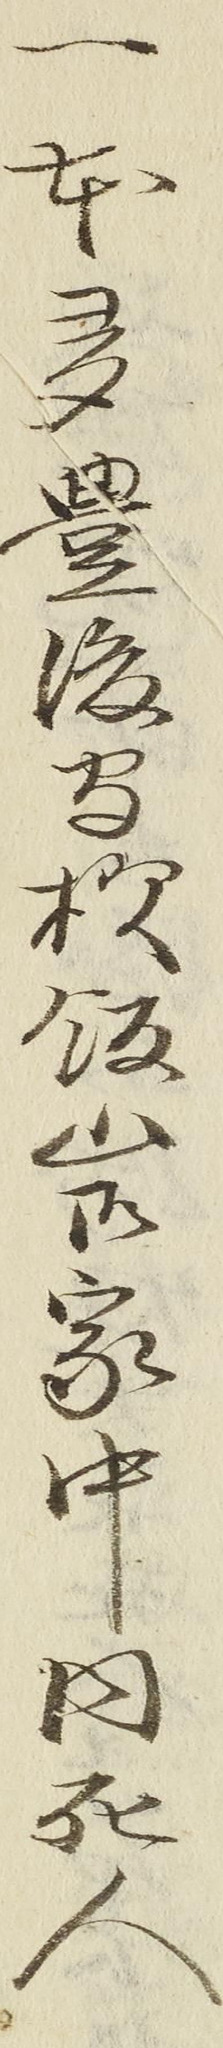一本多豊後守様飯山御家中内死人
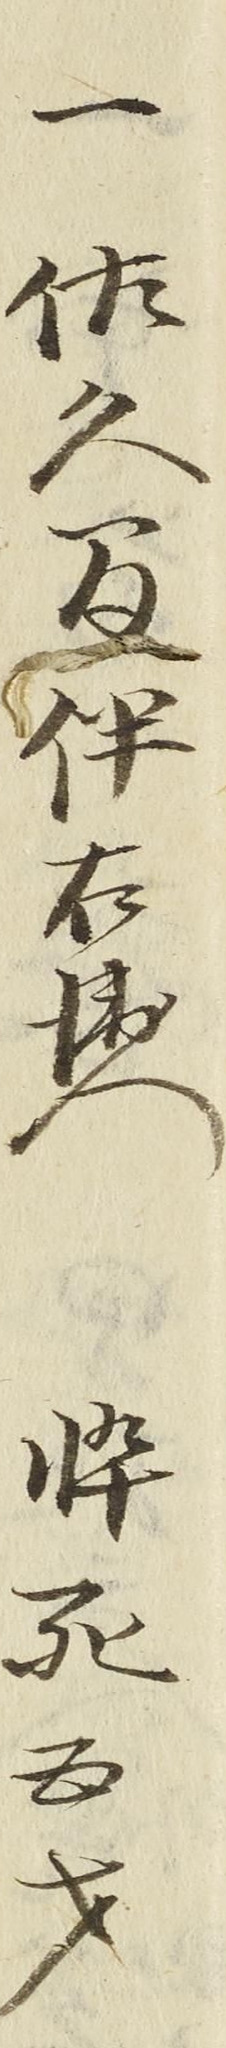一佐久間伴右衛門忰死五才
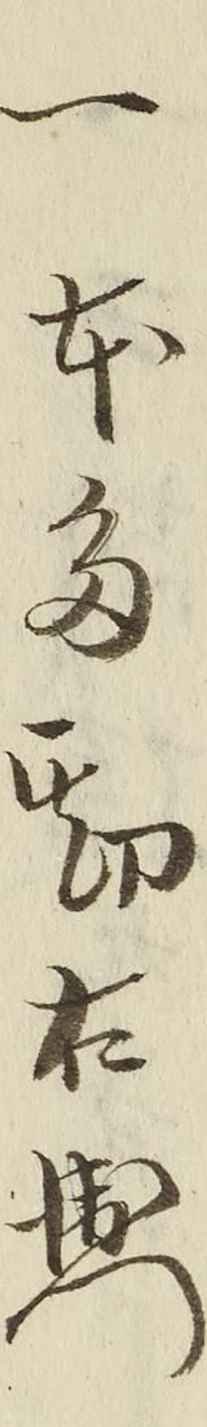一本多勘右衛門同
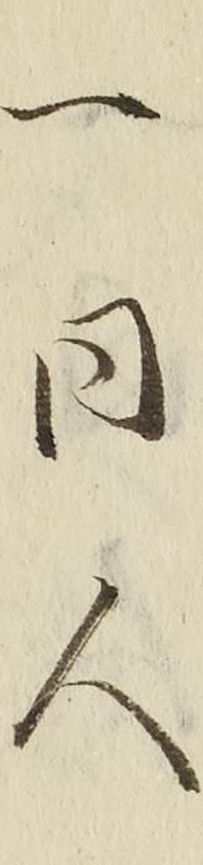一同人

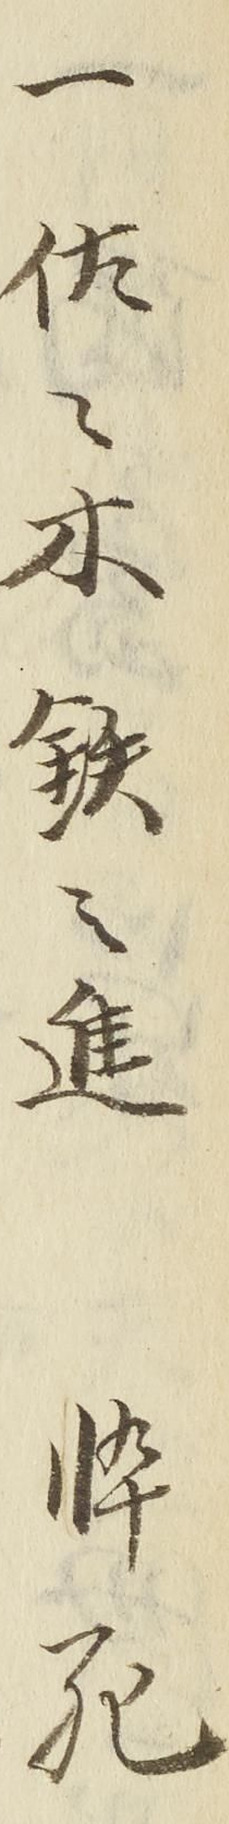一佐々木鉄之丞忰死
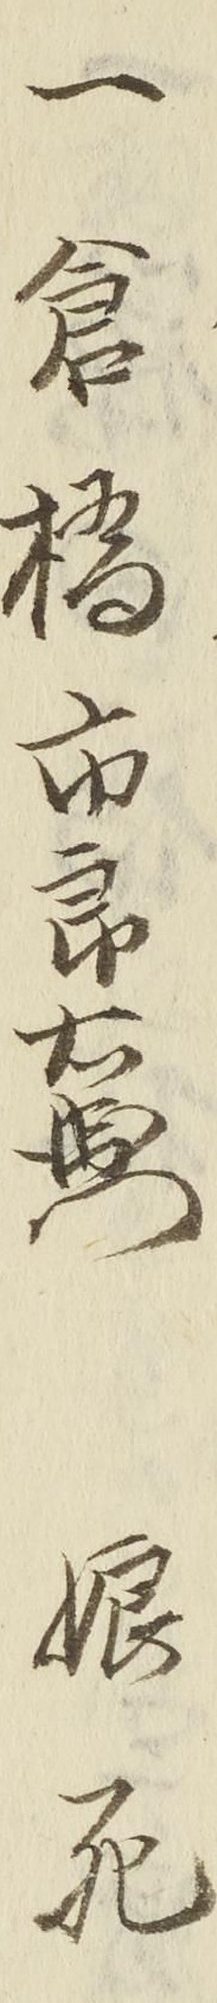一倉橋市郎右衛門娘死
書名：信濃國大地震記　乾
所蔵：東京大学地震研究所図書室 Earthquake Research Institute Library, The University of Tokyo, JAPAN
